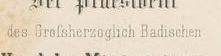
des Grossherzoglich Badischen
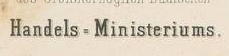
Handels-Ministeriums.
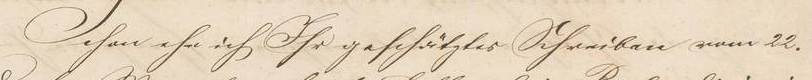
Schon ehe ich Ihr geschätztes Schreiben vom 22.
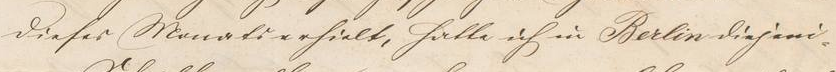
dieses Monats erhielt, hatte ich in Berlin diejeni-
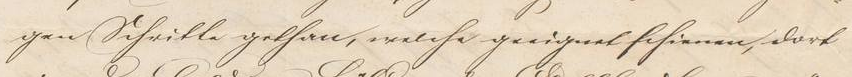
gen Schritte gethan, welche geeignet schienen, dort
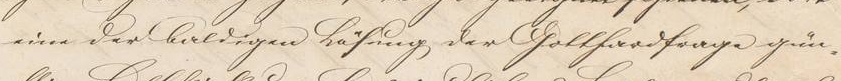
eine der baldigen Lösung der Gotthardfrage gün-
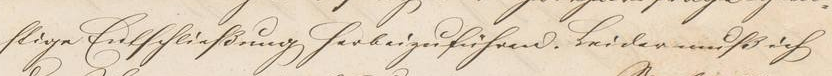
stige Entschließung herbeizuführen. Leider muß ich
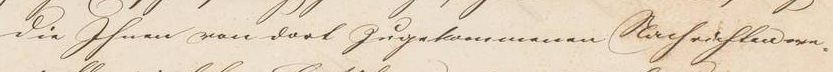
die Ihnen von dort zugekommenen Nachrichten we-
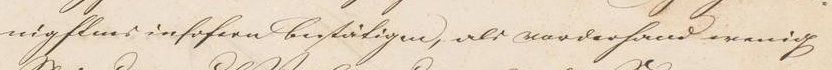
nigstens insofern bestätigen, als vorderhand wenig
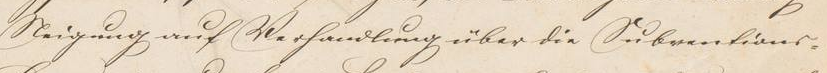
Neigung auf Verhandlung über die Subventions-
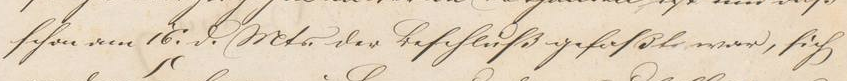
schon am 16. d. Mts. der Beschluß gefaßt war, sich
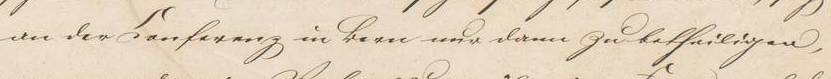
an der Conferenz in Bern nur dann zu betheiligen,
